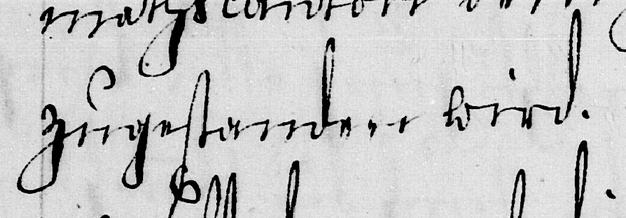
zugestanden wird.
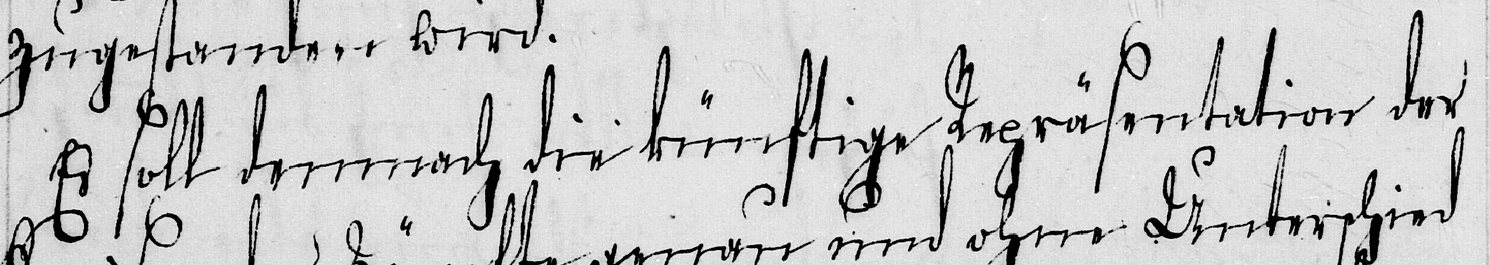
Es soll demnach die künftige Repräsentation der
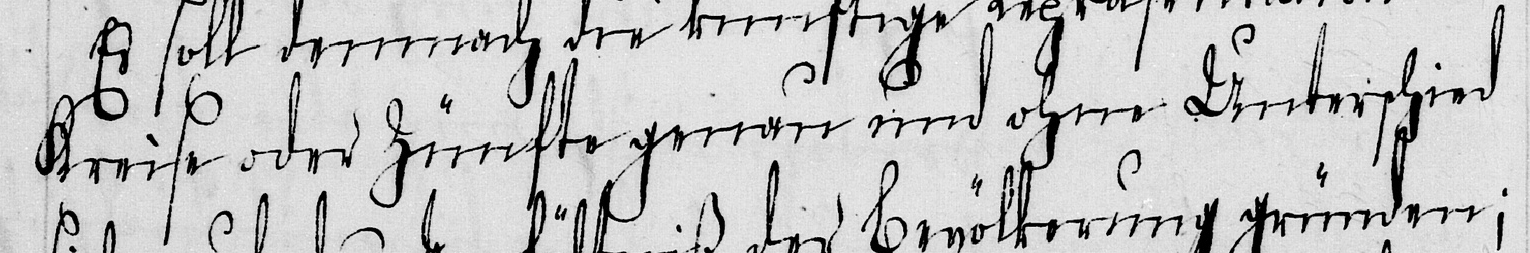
Kreise oder Zünfte genau und ohne Unterschied
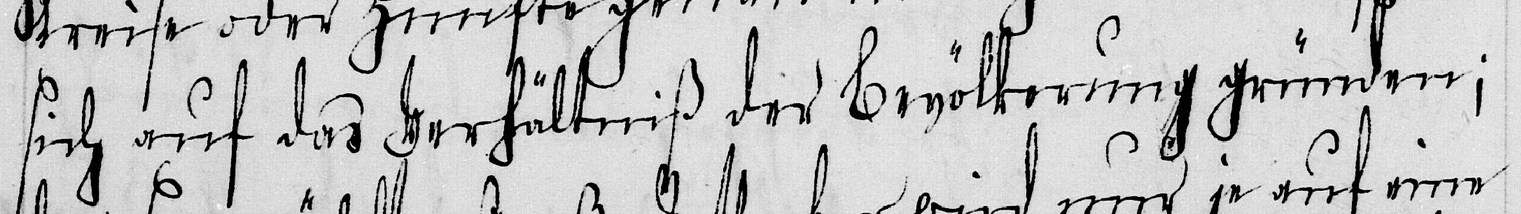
sich auf das Verhältniß der Bevölkerung gründen;
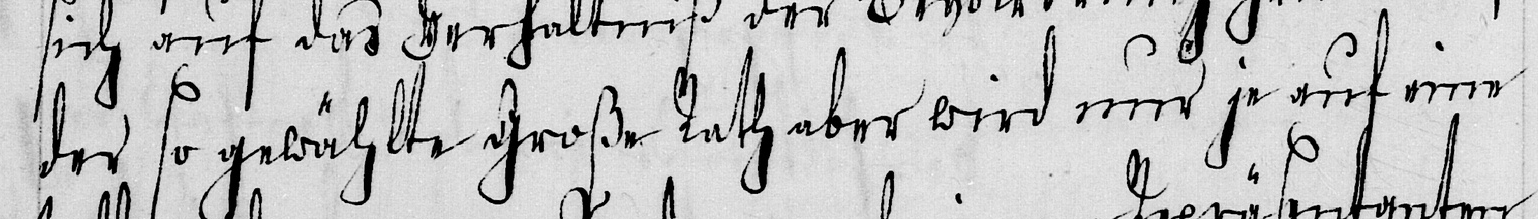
der so gewählte Große Rath aber wird nur je auf eine
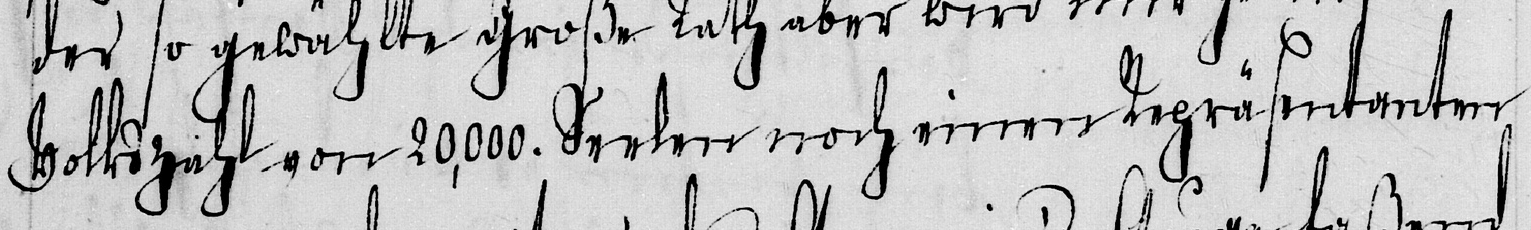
Volkszahl von 20,000. Seelen noch einen Repräsentanten
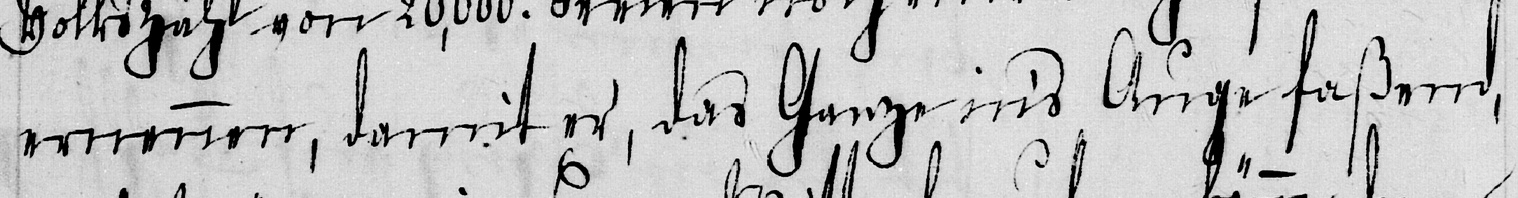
ernennen, damit er, das Ganze ins Auge faßend,
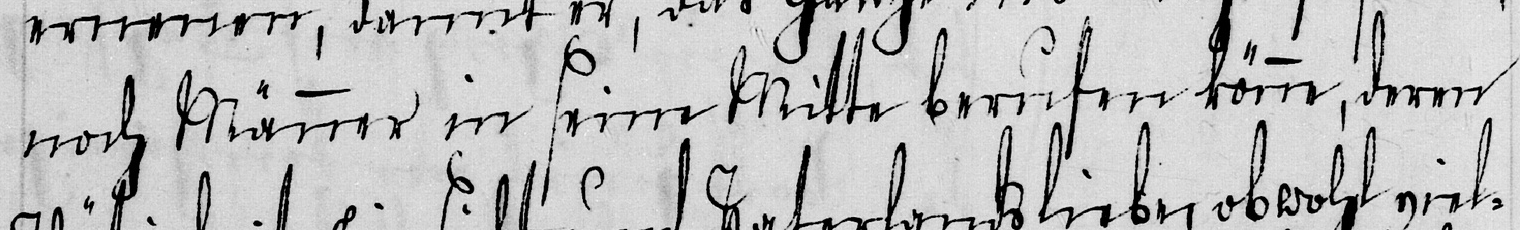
noch Männer in seine Mitte berufen könne, deren
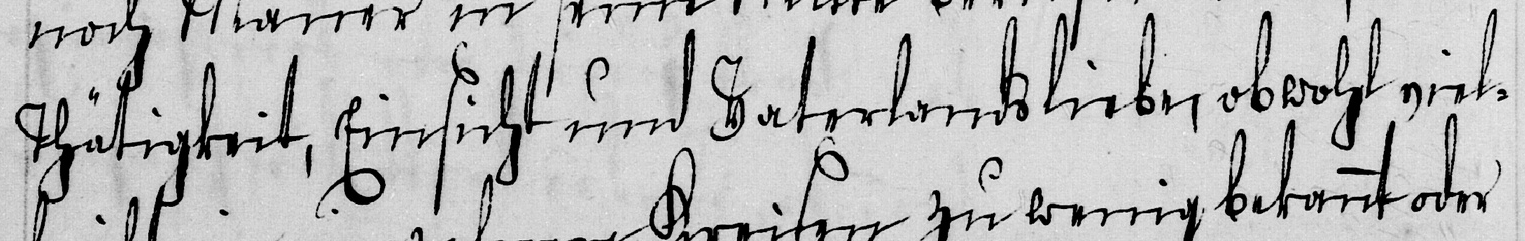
Thätigkeit, Einsicht und Vaterlandsliebe, obwohl vie¬
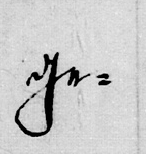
gle¬
